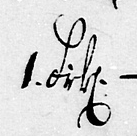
trich¬
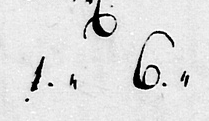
zu en¬
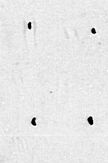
3.
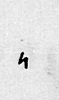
6.
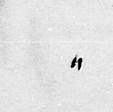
3. “
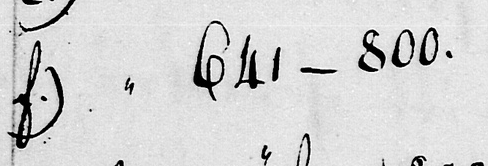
“ 641 – 800.
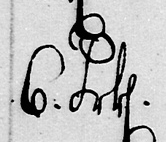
so daß
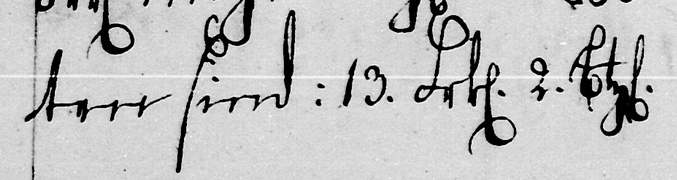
ten sind: 13. Frk[en]. 2.
